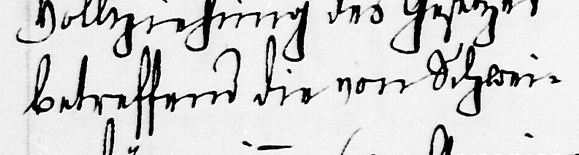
betreffend die von Schwei¬
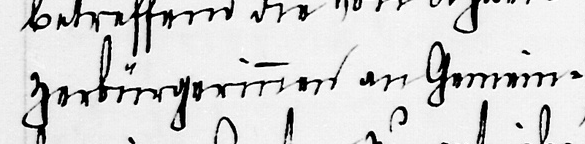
zerbürgerinnen an Gemein-
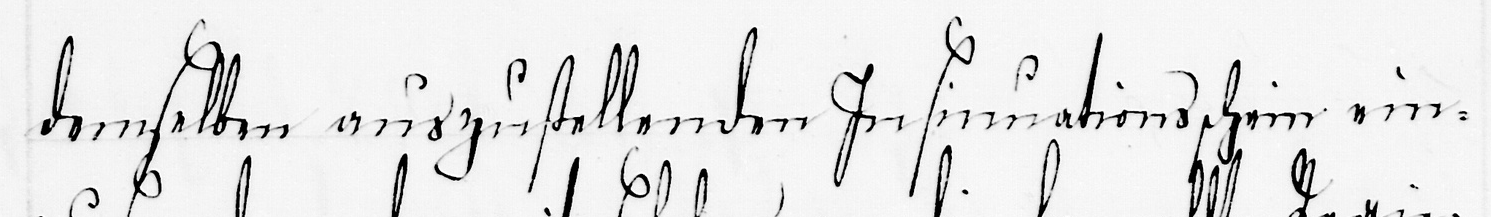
demselben auszustellenden Insinuationsschein ein¬
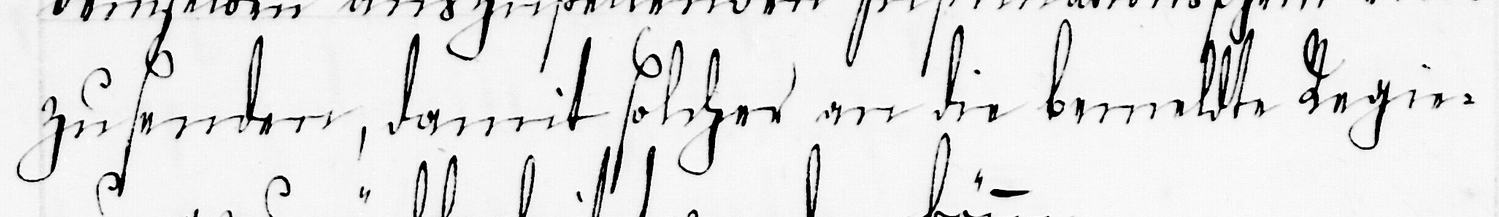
zusenden, damit solcher an die bemeldte Regie¬
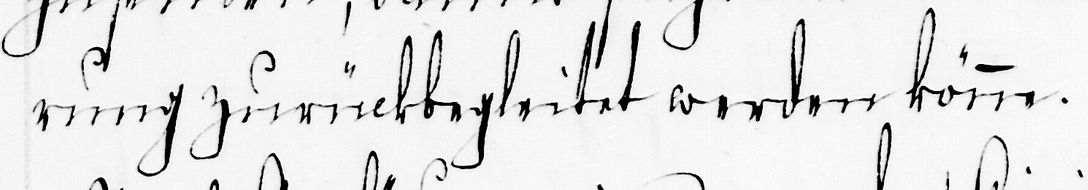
rung zurückbegleitet werden könne.
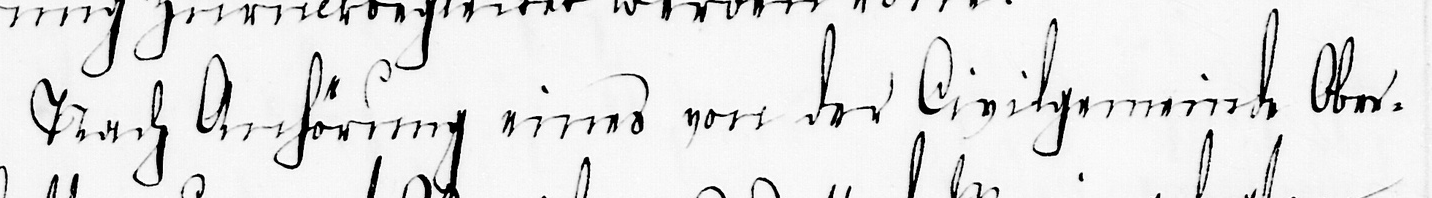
Nach Anhörung eines von der Civilgemeinde Ober¬
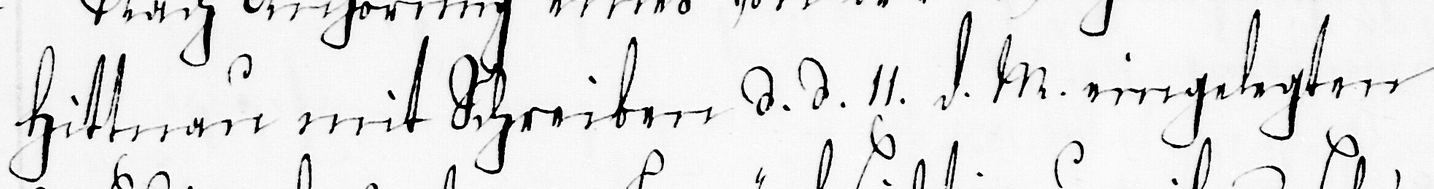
hittnau mit Schreiben d. d. 11. d. M. eingelegten
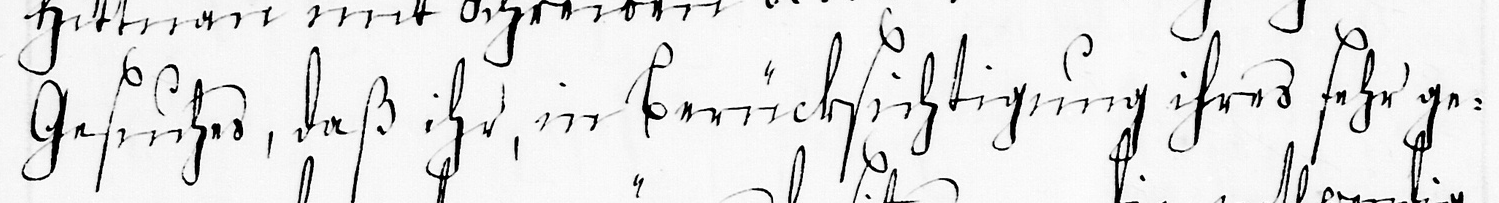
Gesuches, daß ihr, in Berücksichtigung ihres sehr ge¬
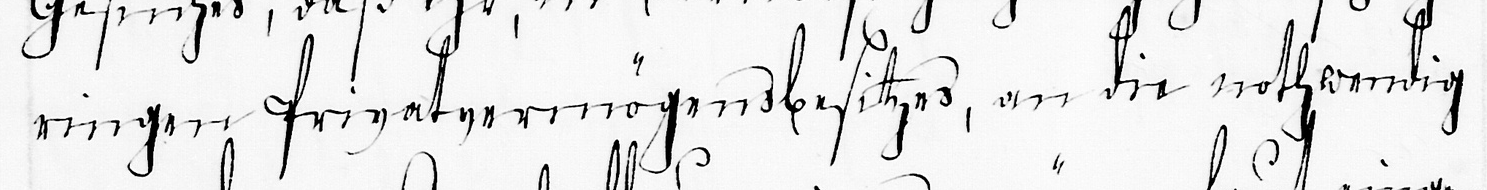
ringen Privatvermögensbesitzes, an die nothwending
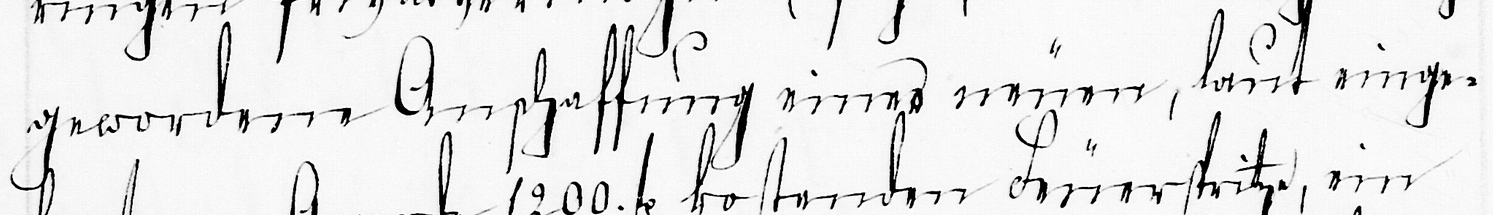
gewordene Anschaffung einer neuen, laut einge¬
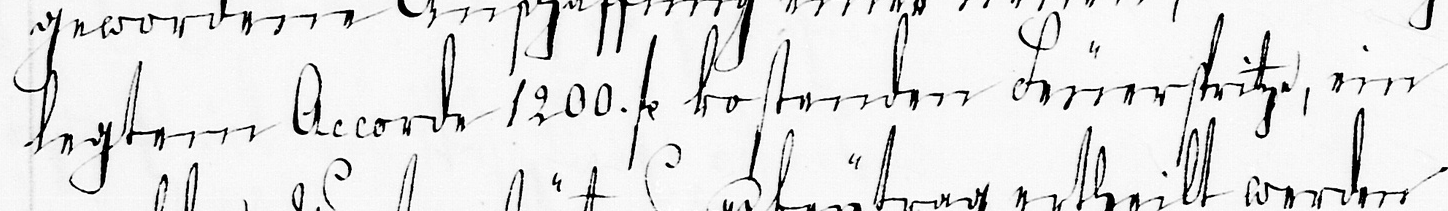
legtem Accorde 1200. fl. kostenden Feuerspritze, ein
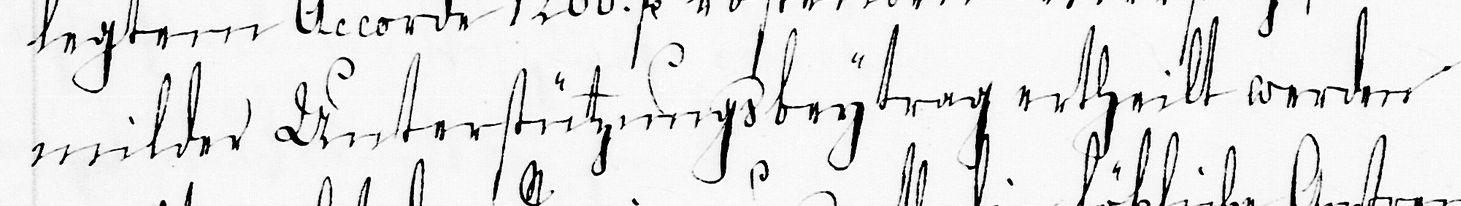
milder Unterstützungsbeytrag ertheilt werden
